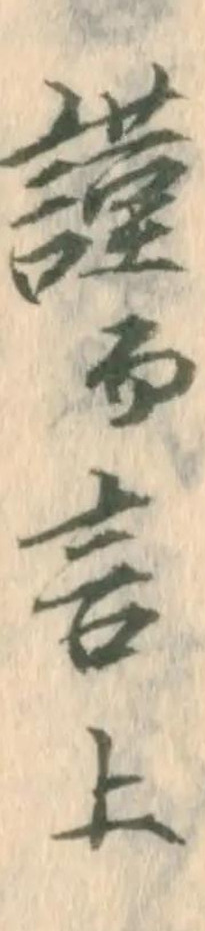謹而言上
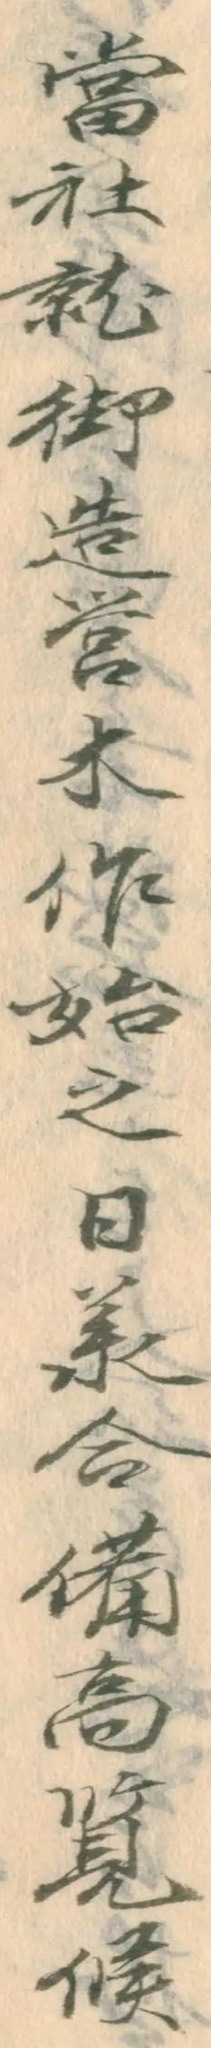当社就御造営木作始之日承合備高覧候
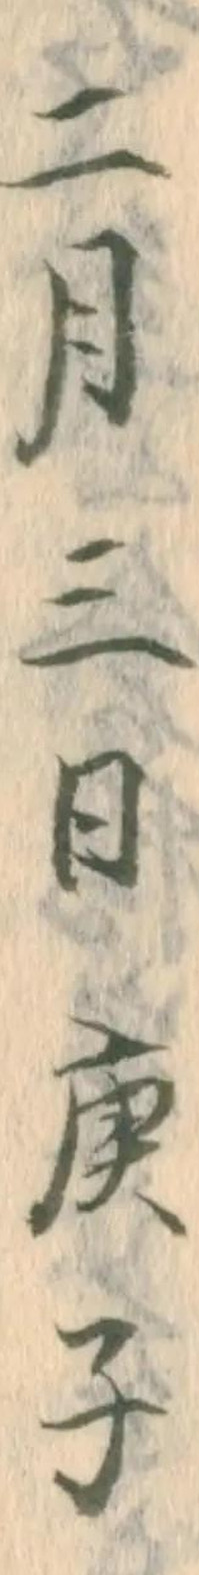二月三日庚子
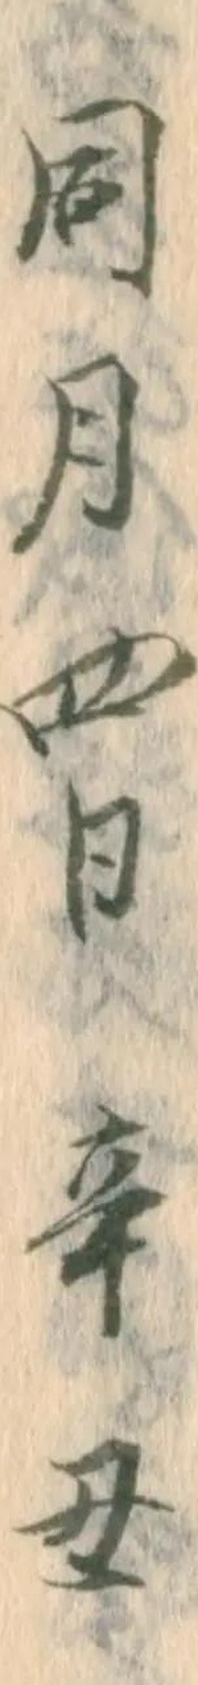同月四日辛丑
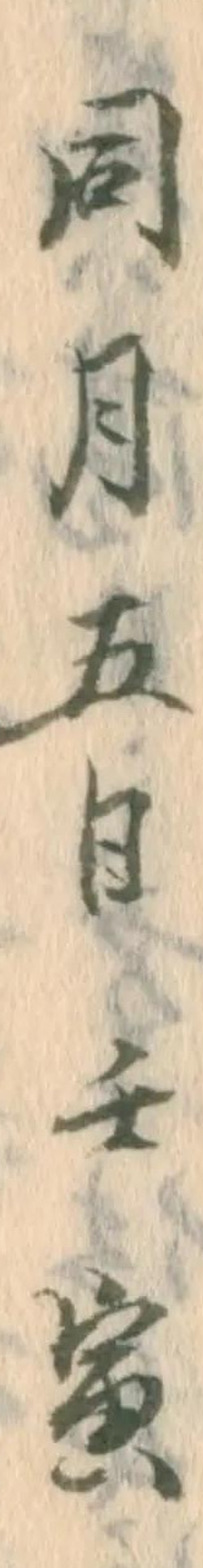同月五日壬寅
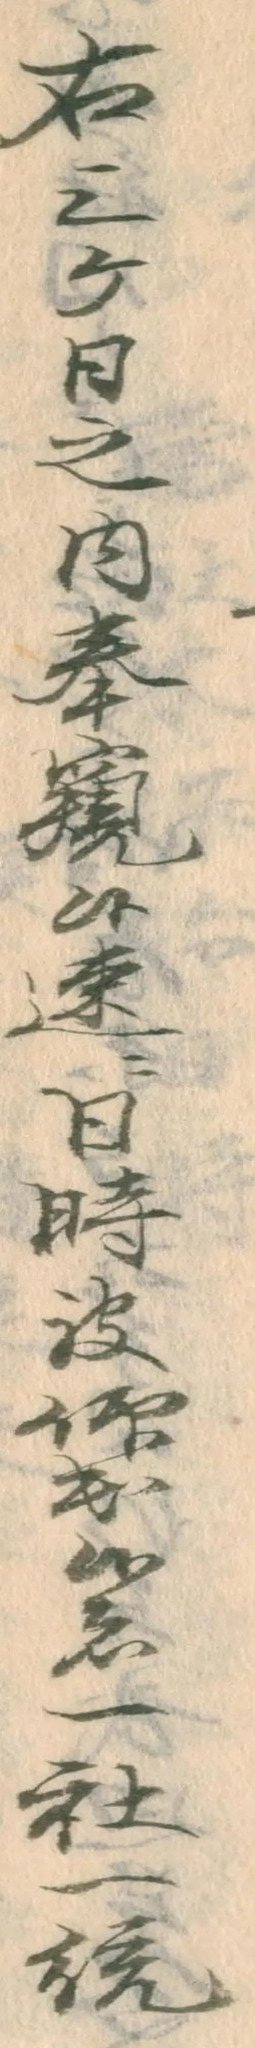右三ケ日之内奉窺候速ニ日時被仰出候は一社一統
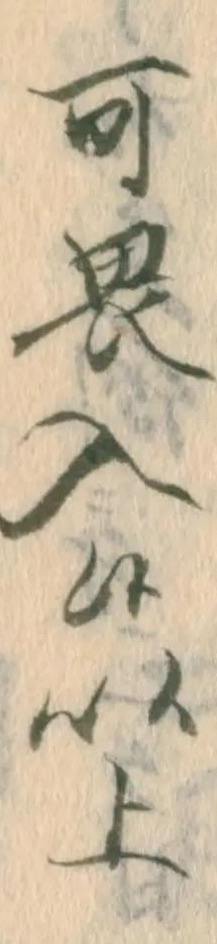可畏入候以上
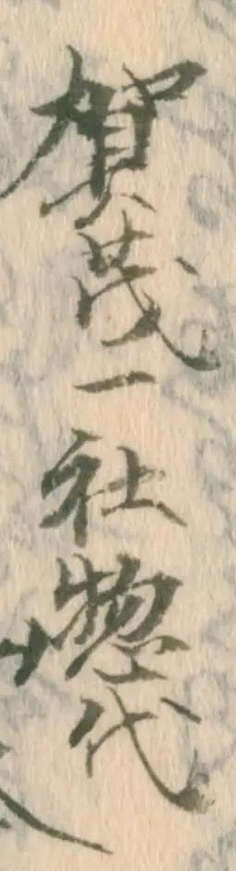賀茂一社惣代
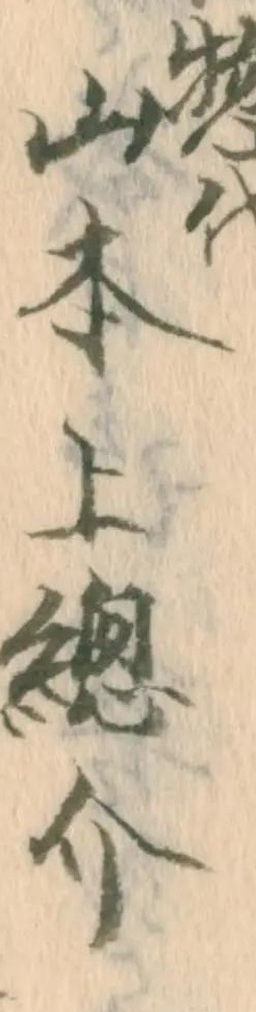山本上總介
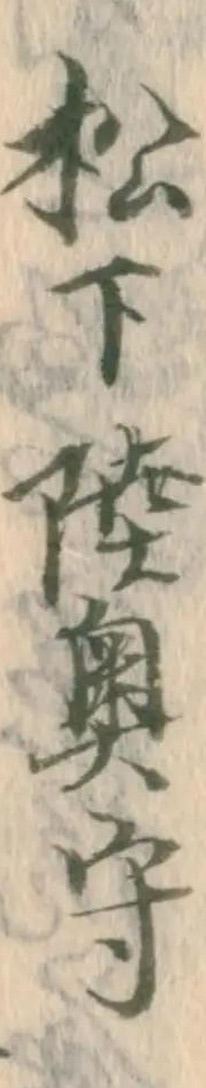松下陸奥守
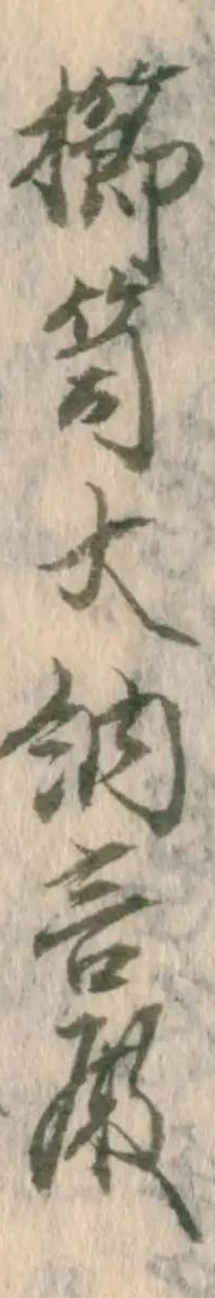櫛笥大納言殿
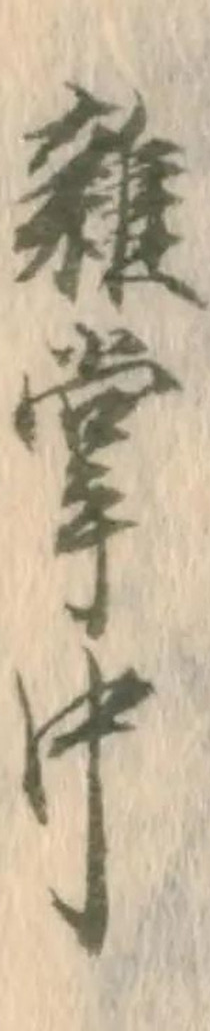雑掌中
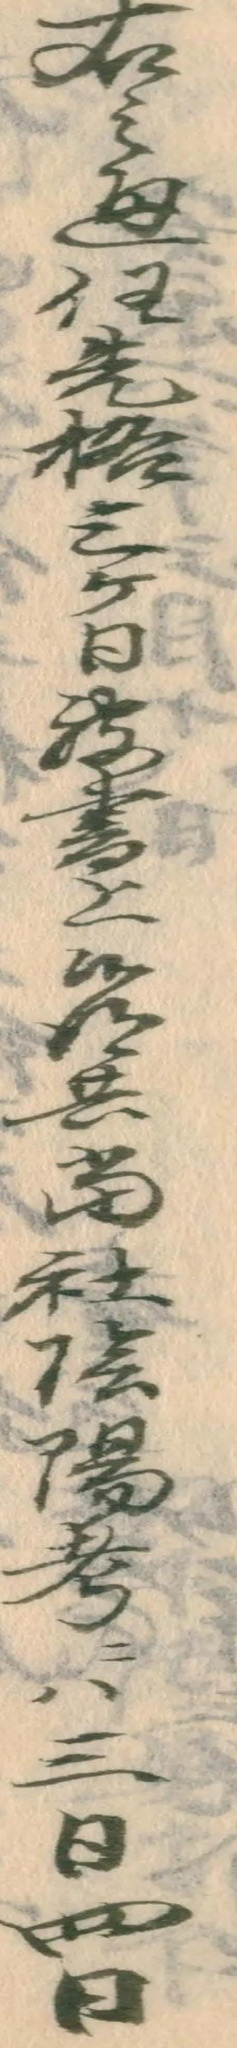右之通任先格三ヶ日被書上候得共当社陰陽考ニハ三日四日
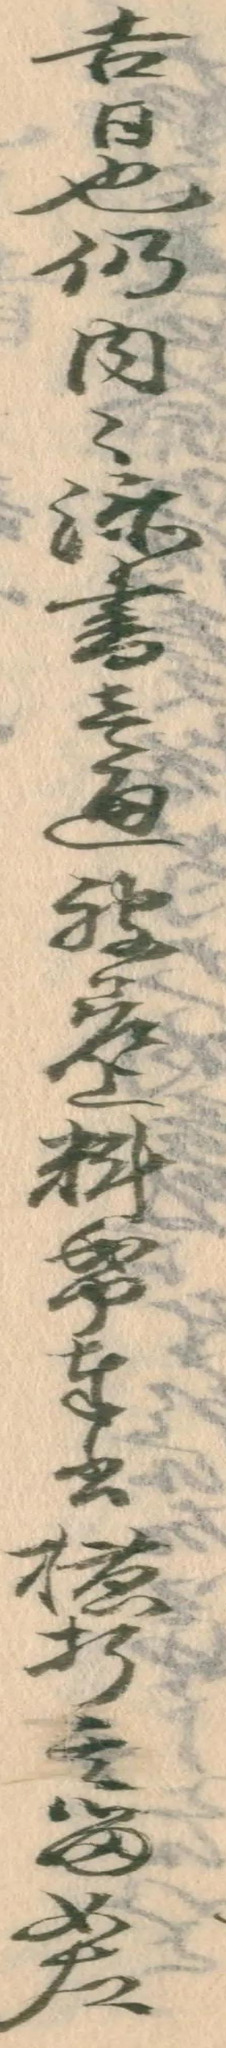吉日也仍内々添書壱通被差上料帋奉書横折其留如左
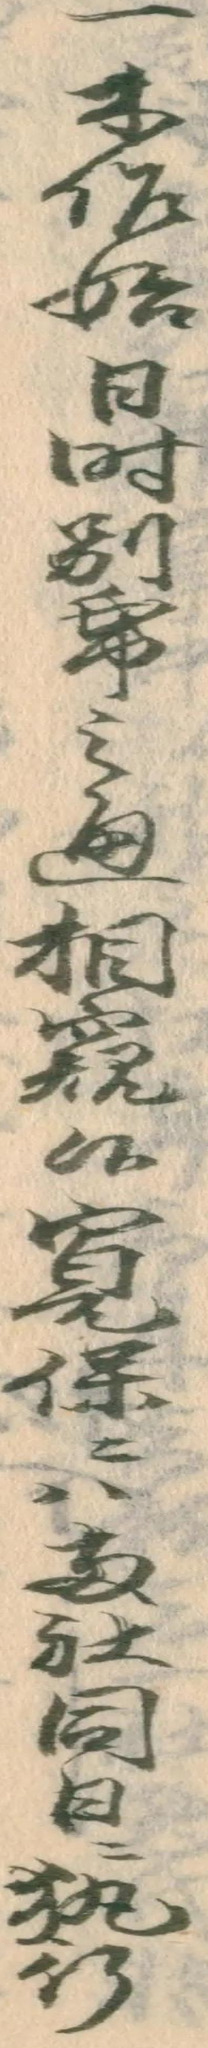一木作始日時別帋之通相窺候寛保ニハ両社同日ニ執行
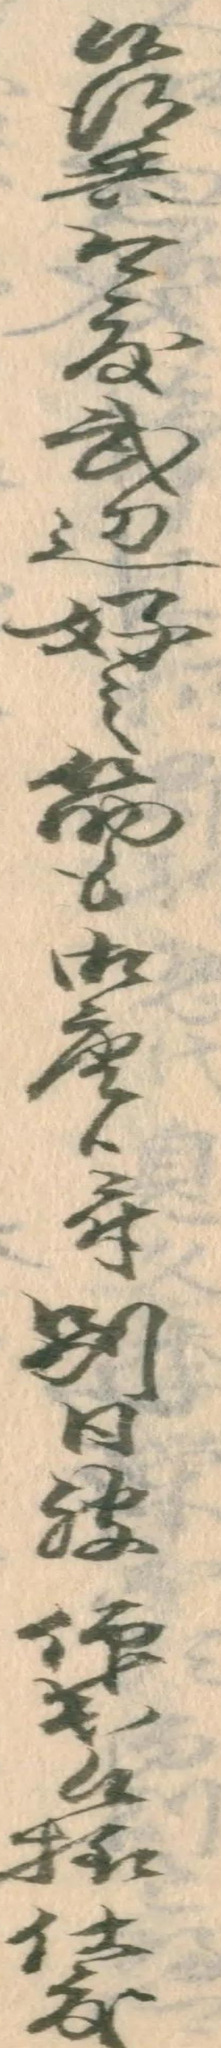候得共今度武辺好之筋も御座候ニ付別日被仰出候様仕度
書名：賀茂社記録. 第17冊
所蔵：国立国会図書館 National Diet Library, JAPAN
